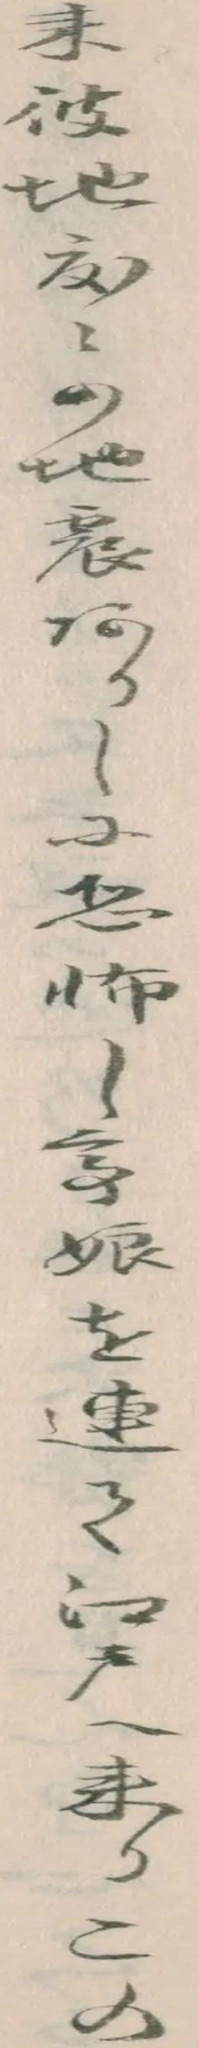来彼地度々の地震ありしに恐怖して娘を連て江戸へ来りこの
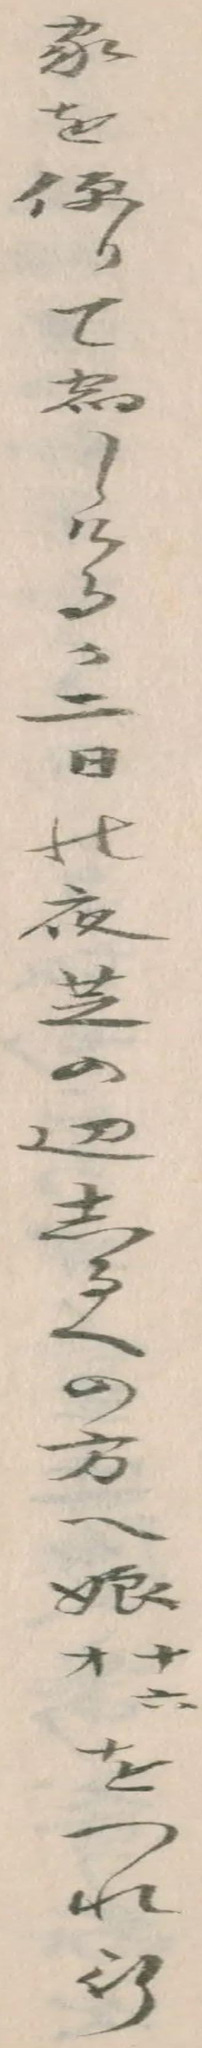家を便りて宿しけるか二日の夜柴の辺しるへの方へ娘十六才をつれ行
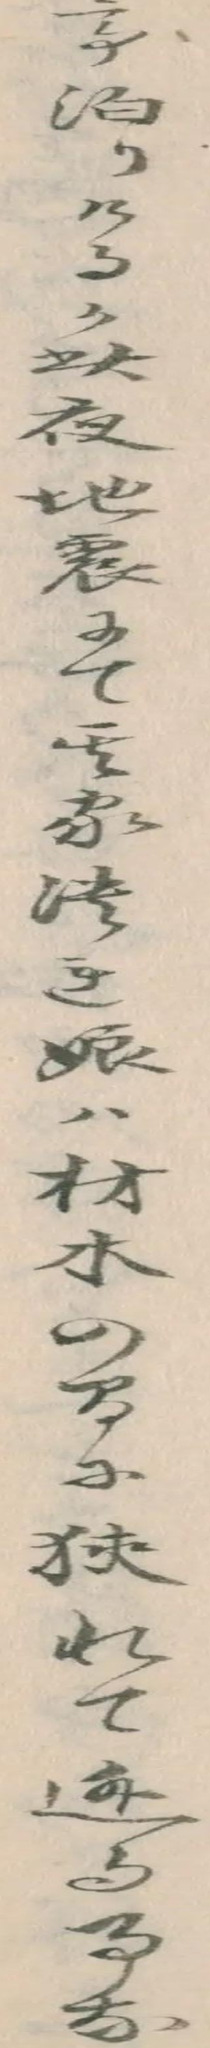て泊りけるか此夜地震にて其家潰れ娘は材木の間に挟れて逃る事な

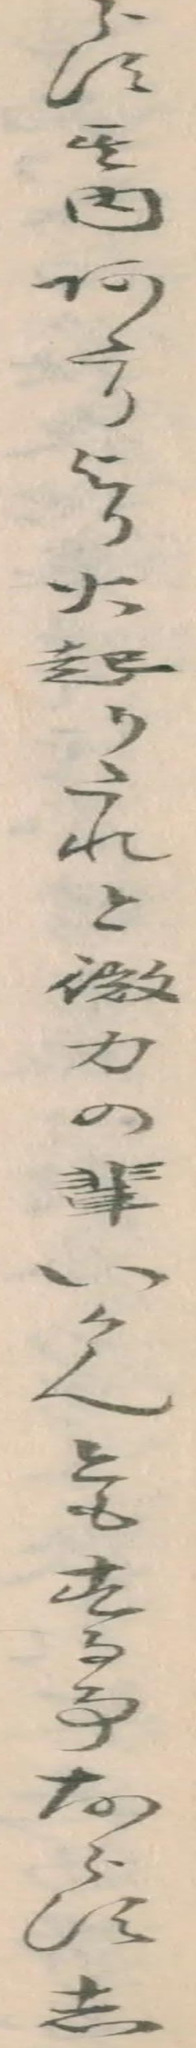らす其内あたりより火起り起りたれと微力の輩いかんともする事ならすし
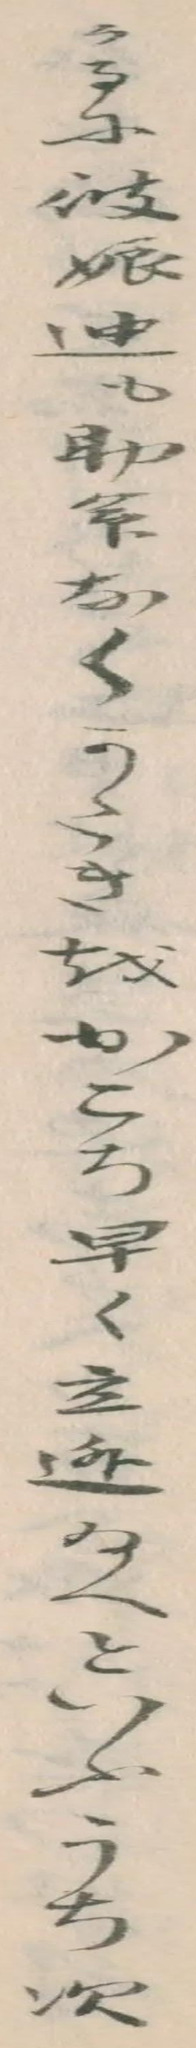かるに彼娘迚も助命なくかたきをかこち早く立逃給へといふうち次
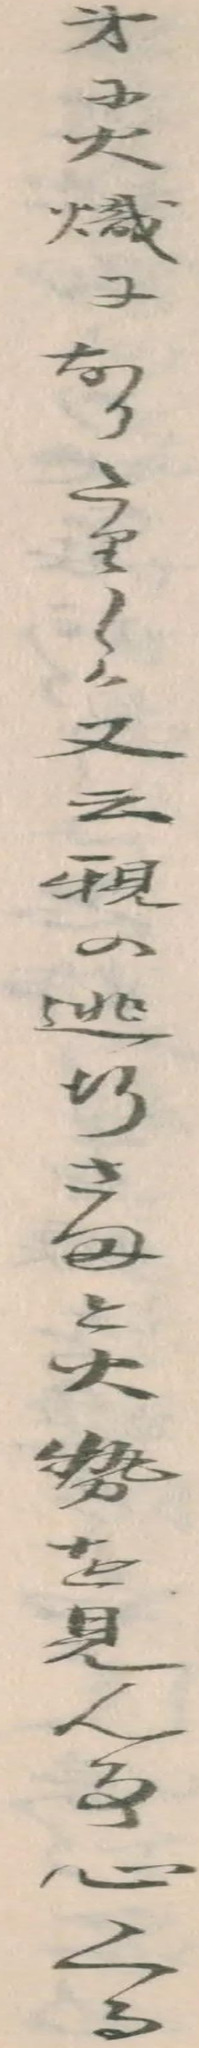第に火熾になりたりしか又云親の逃行さまと火勢を見ん事心くる
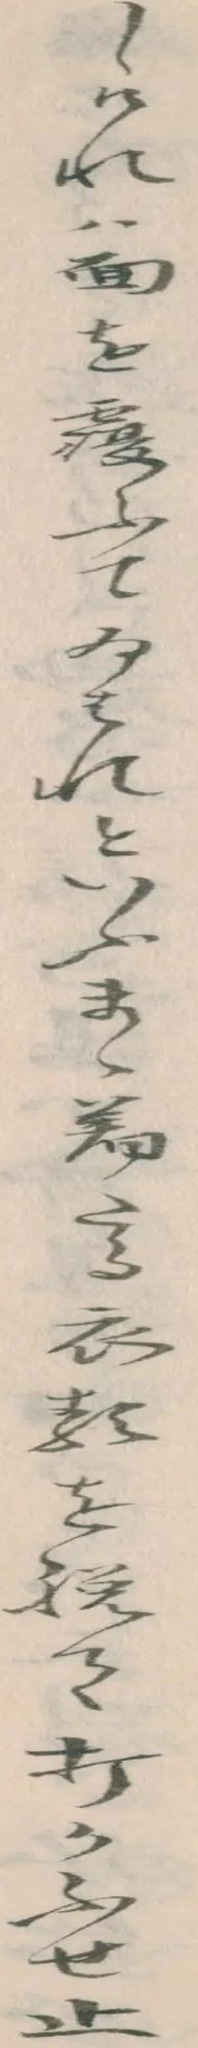しけれは面を覆ふて給はれといふまゝ着たる衣類を脱て打かふせ止
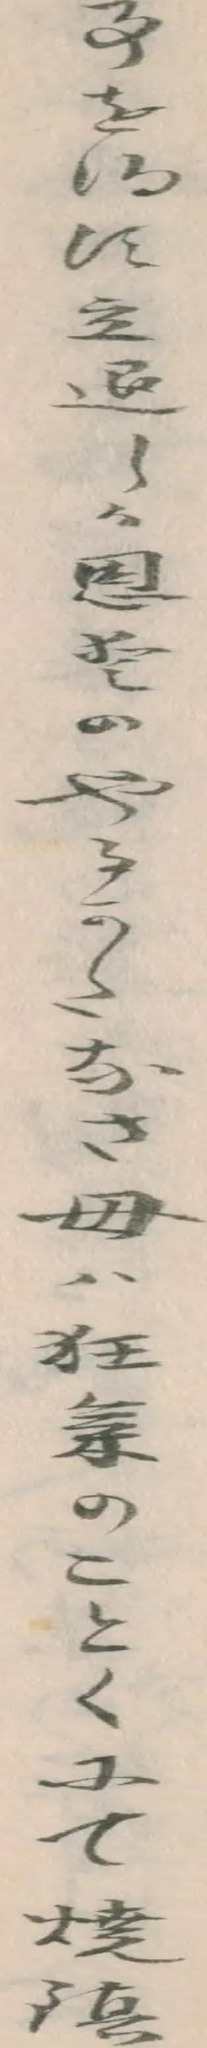事を得す立退しか思そのやるかたなさ母は狂気のことくにて焼鎮
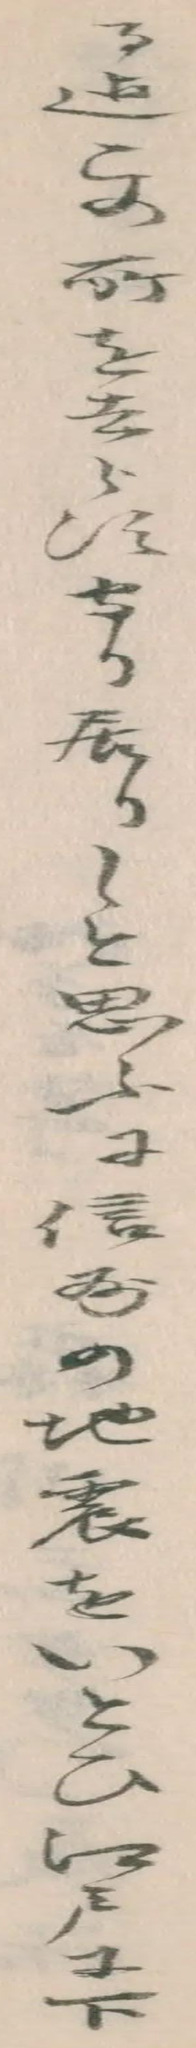る迄この所を去らす守り居りしと思ふに信州の地震をいとひ江戸に下
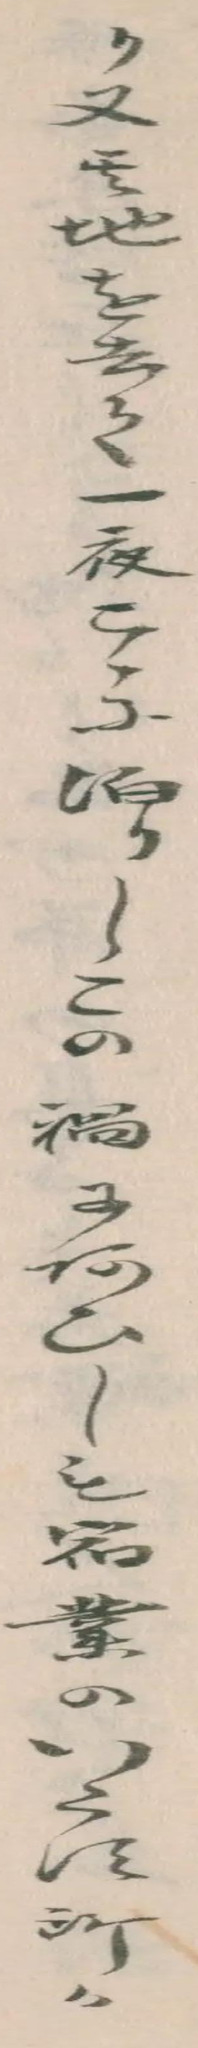り又其地を去て一夜こゝにと泊りしこの禍にあひしも宿業のいたす所か
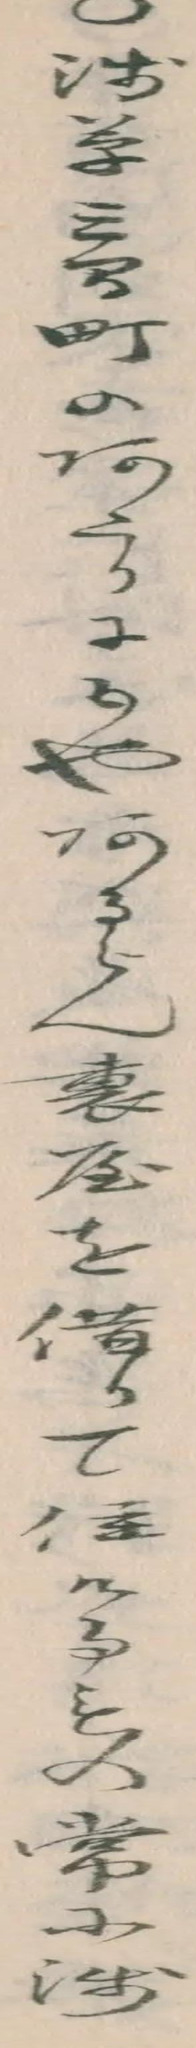〇浅草三間町のあたりにもやあるらん裏屋を借りて住けるもの常に浅
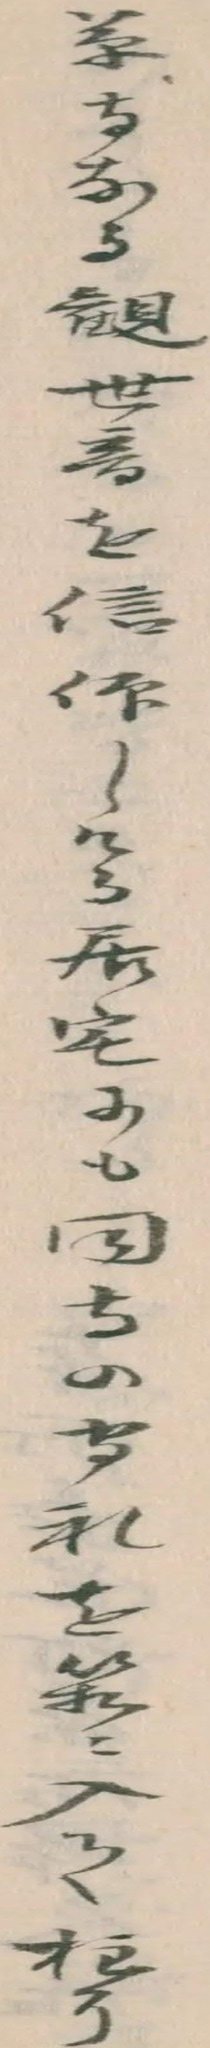草寺なる観世音を信仰しける居宅にも同寺の守札を箱に入て柱に
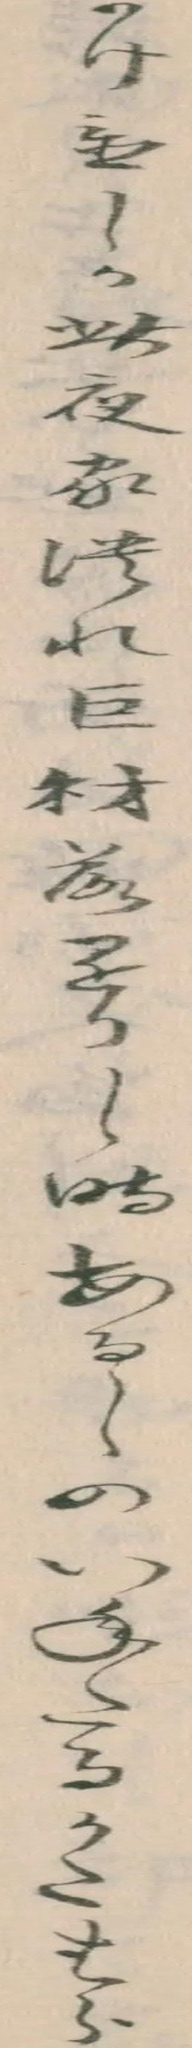かけ置しか此夜家潰れ巨材落懸りし時あるしのいねたるかたはら
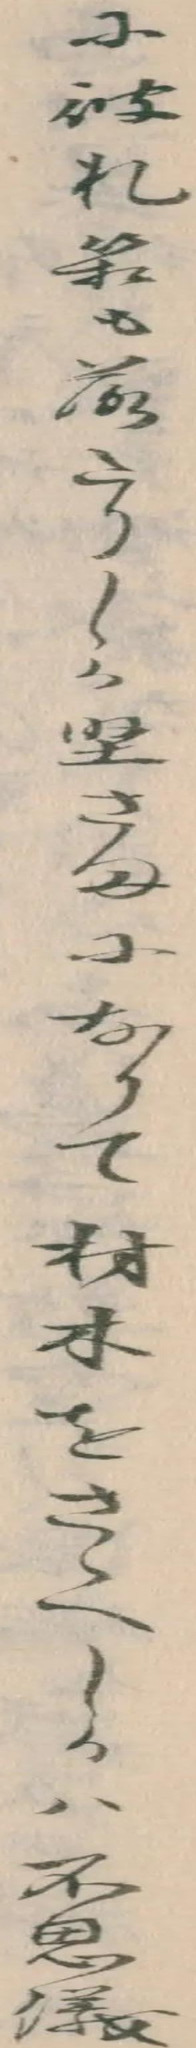に彼札箱も落たりしか堅さまになりて材木をさゝへしかは不思議
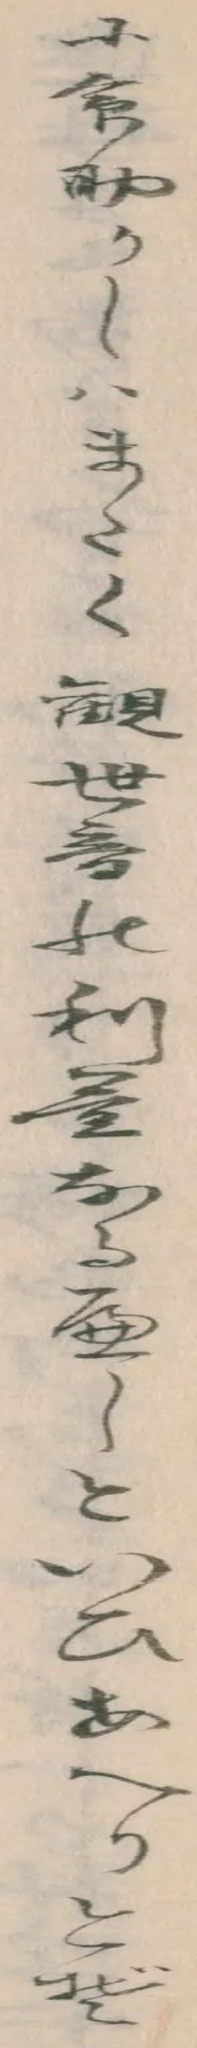に命助りしはまたく観世音の利益なるへしといひあへりとそ
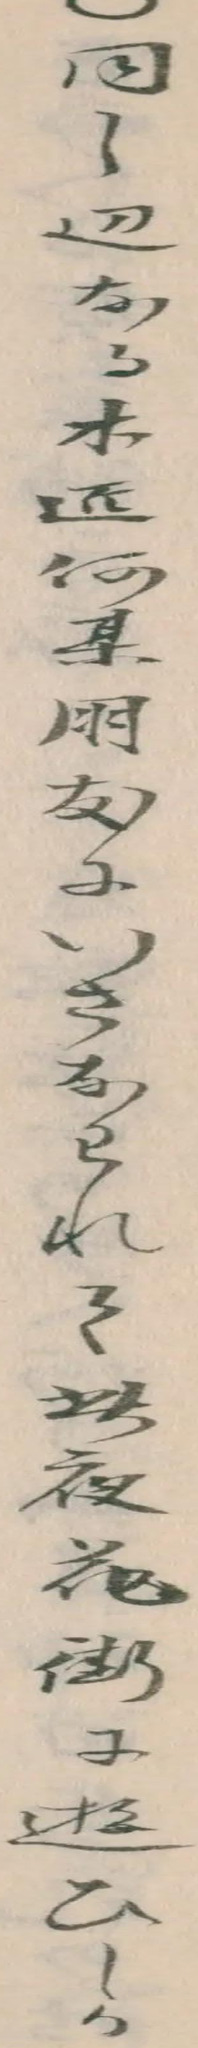〇同し辺なる木匠何某朋友にいさなわれて此夜花街に遊ひしか
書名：地災撮要. 巻7-9(地震之部)
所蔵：国立国会図書館 National Diet Library, JAPAN
